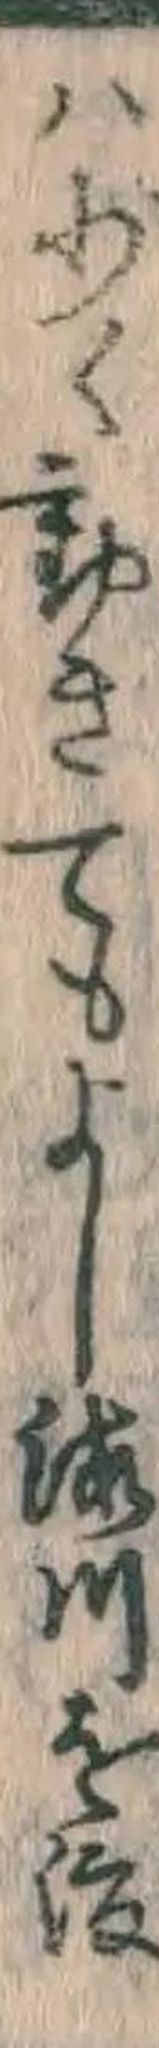は少く動きてもよし海川を渡
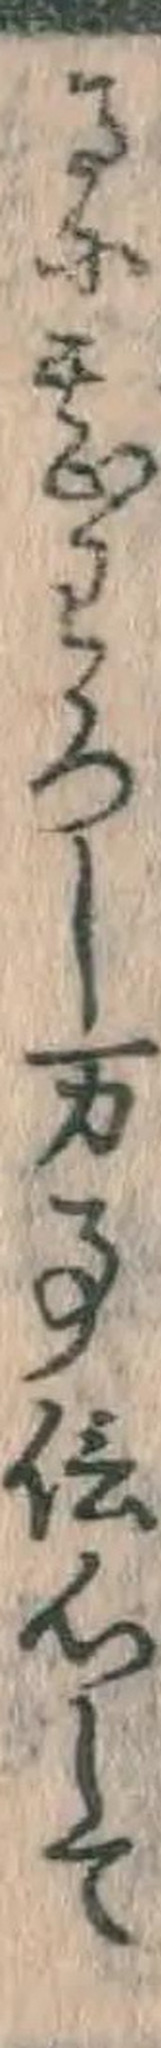るに甚わろし万事信心して
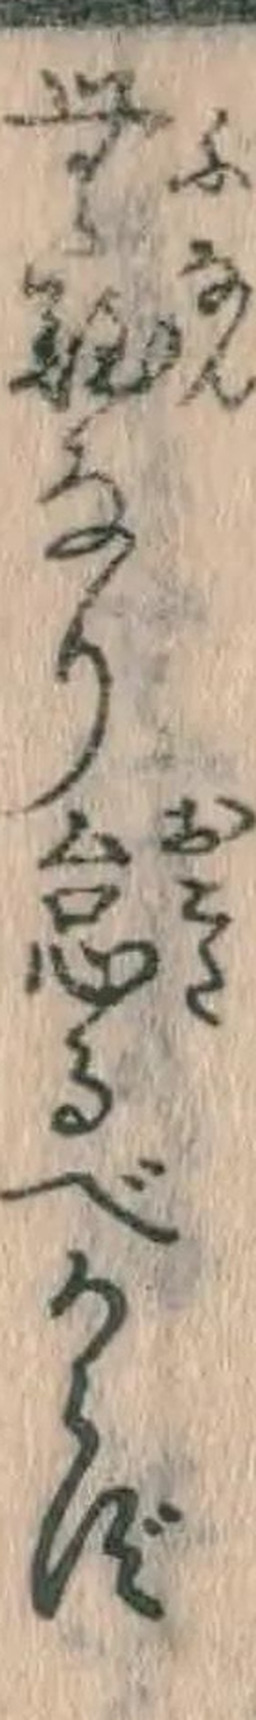無難なり怠るべからず
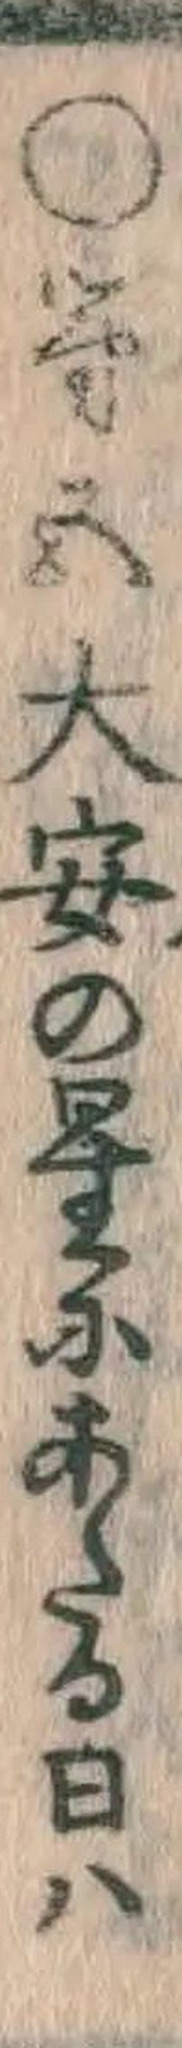○第五大安の星にあたる日は
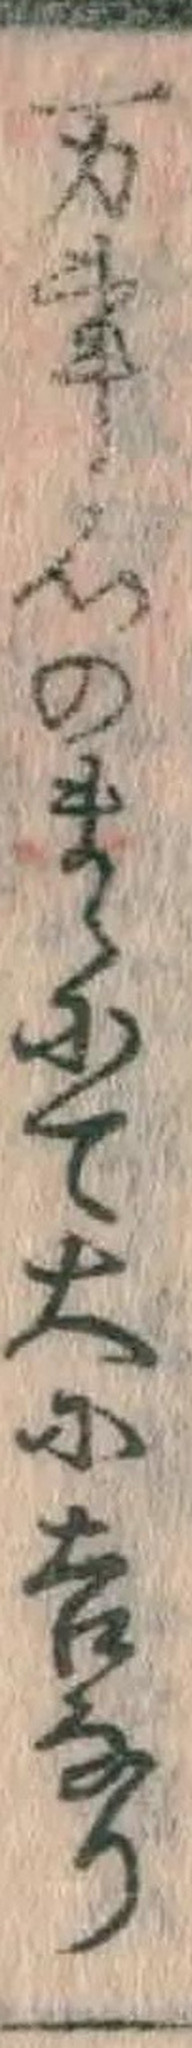万事心のまゝにて大に吉なり
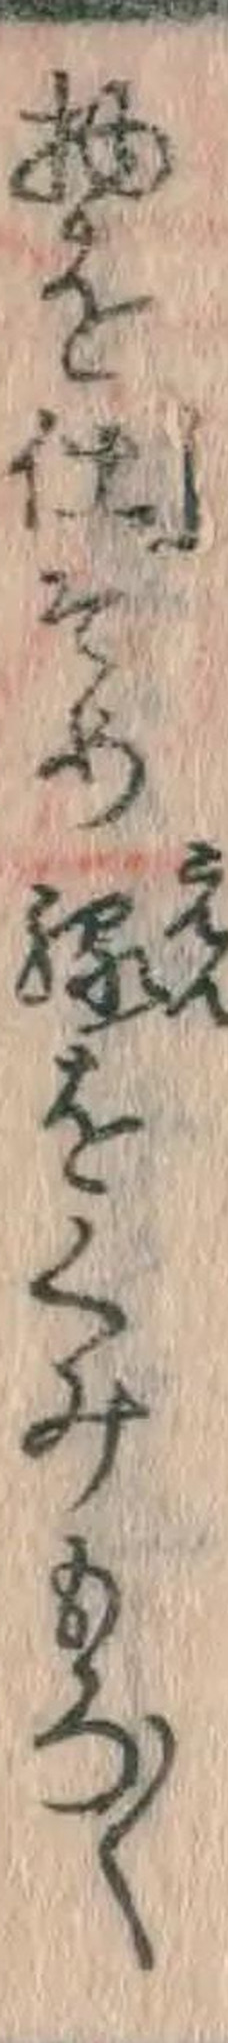物を仕そめ縁をくみもろ〳〵
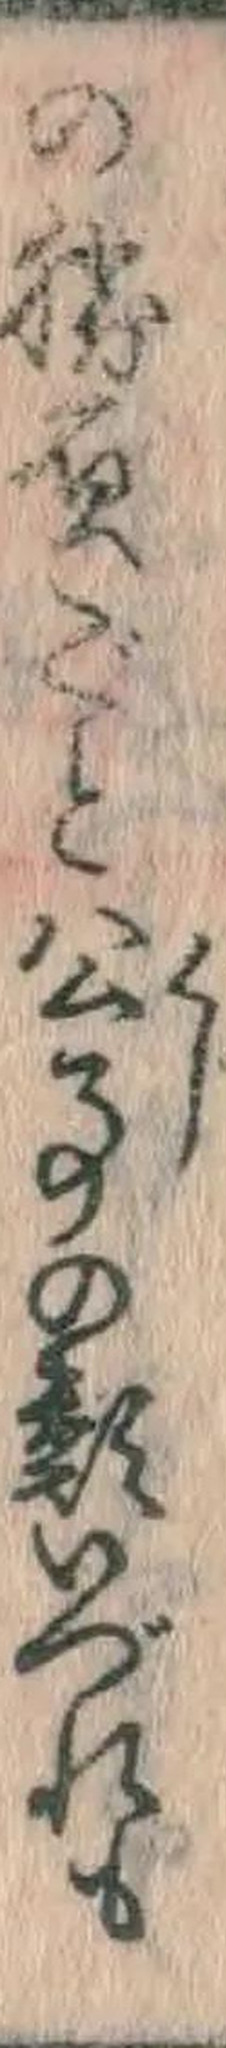の勝負ごと公事の類いづれも
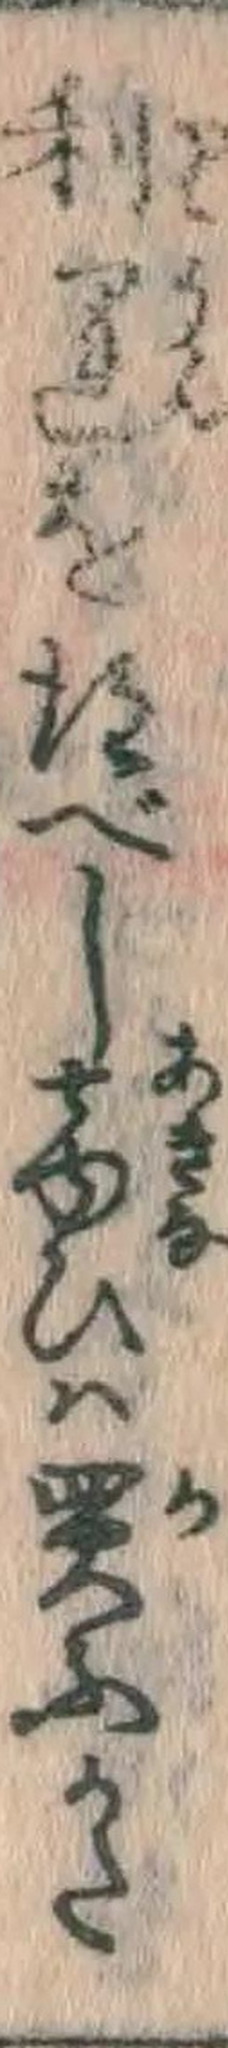利運を得べし商ひは買ふかた
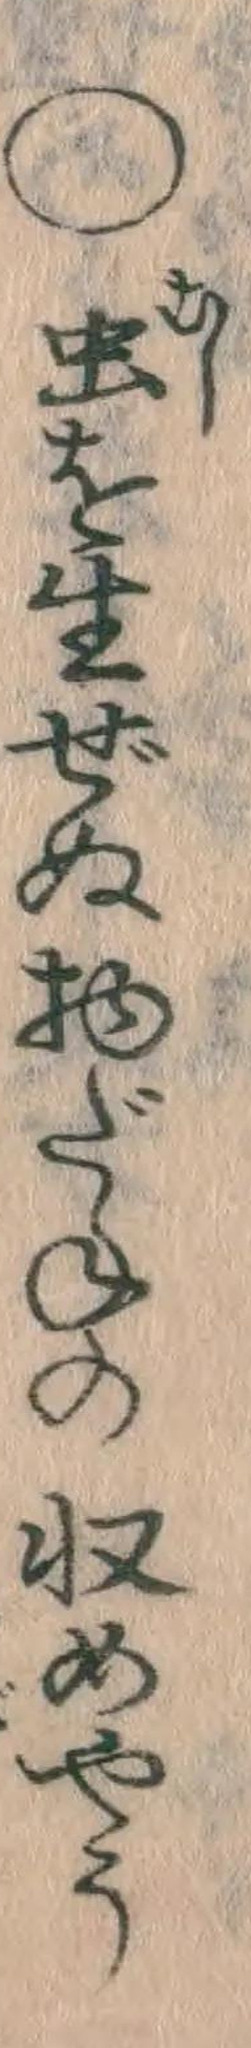○虫を生ぜぬ物だねの収めやう
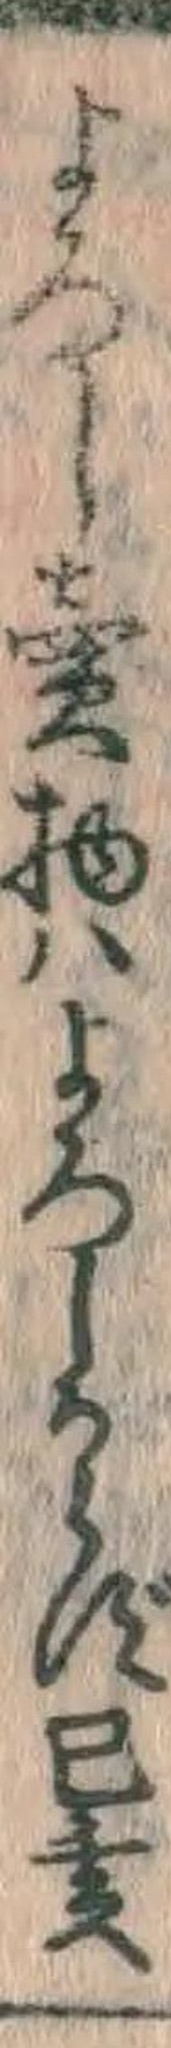よろし売物はよろしからず巳亥
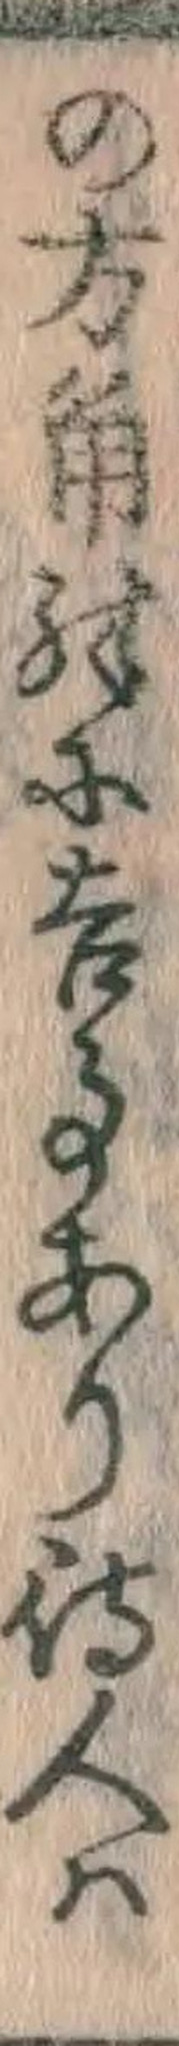の方角殊に吉事あり待人は
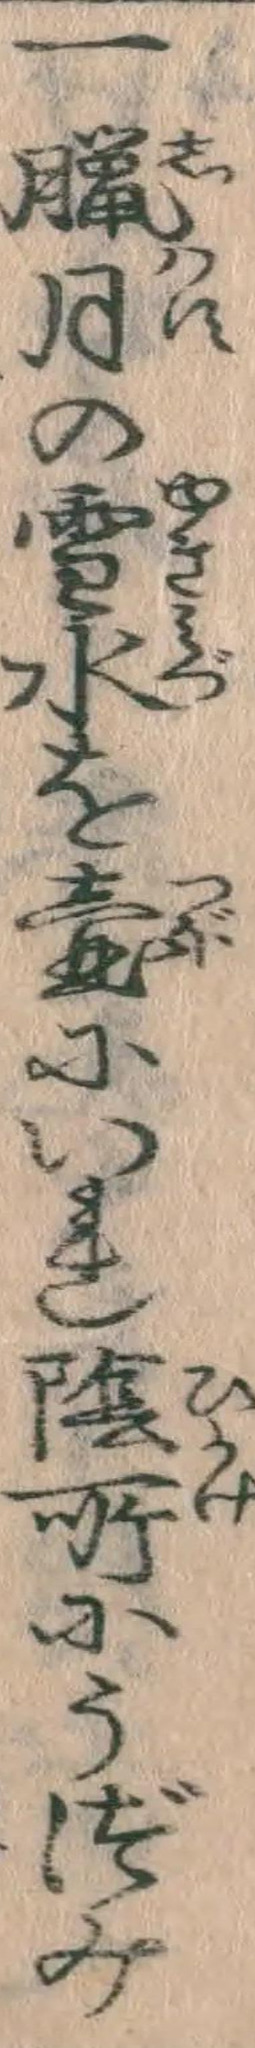一臘月の雪水を壺に入れ陰所にうづみ
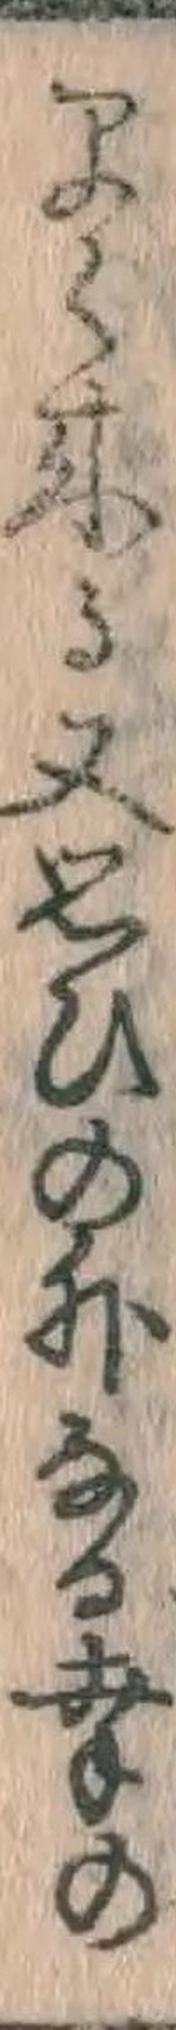早く来る又思ひの外なる幸の
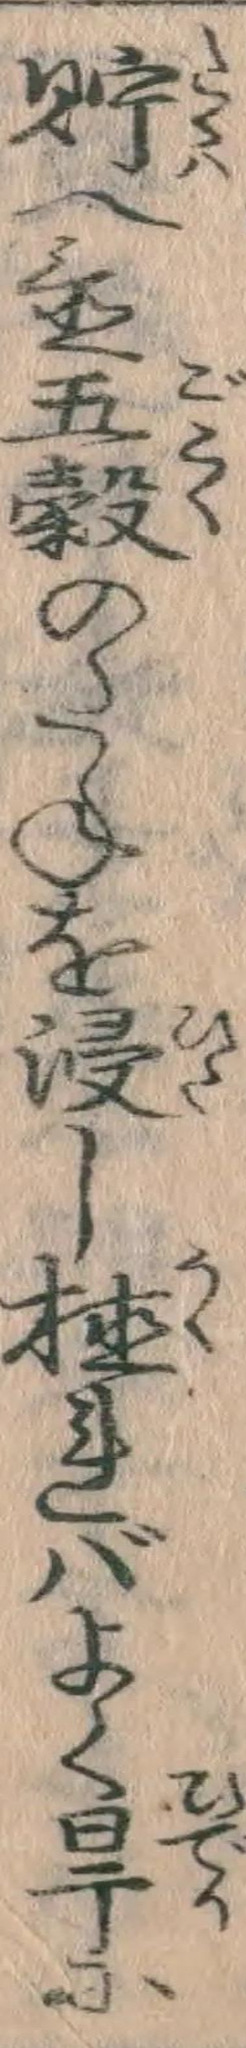貯へ置五穀のたねを浸し植ればよく旱に
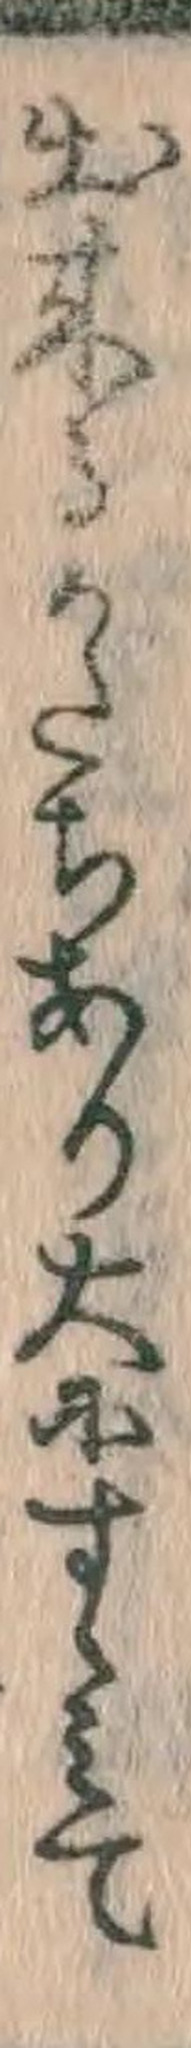出来るかたちあり大にすゝみて
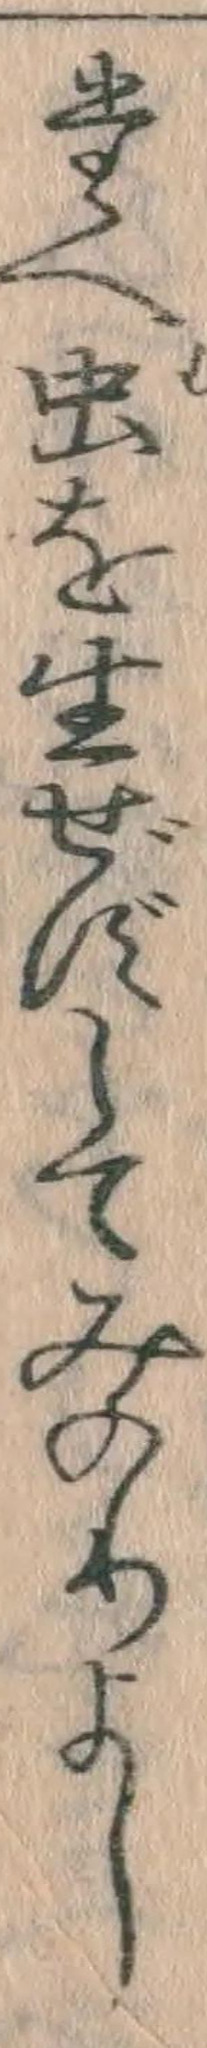たへ虫を生ぜずしてみのりよし
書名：広益秘事大全 3巻. [2]
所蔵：国立国会図書館 National Diet Library, JAPAN
